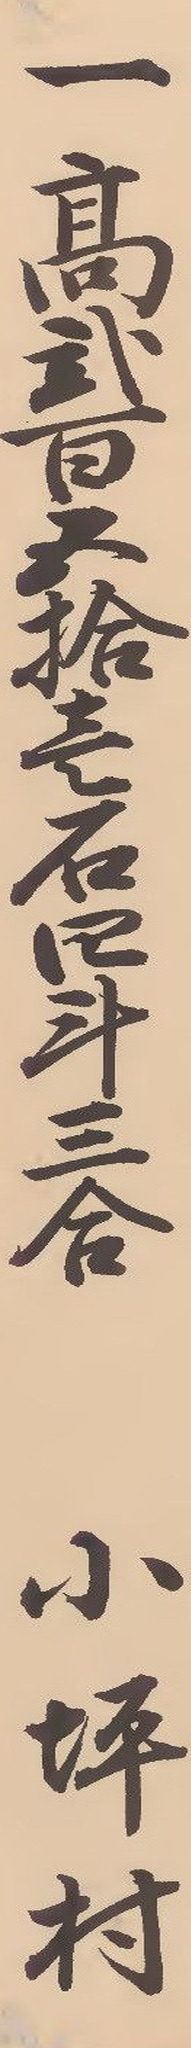一高弐百五拾壱石四斗三合小坪村
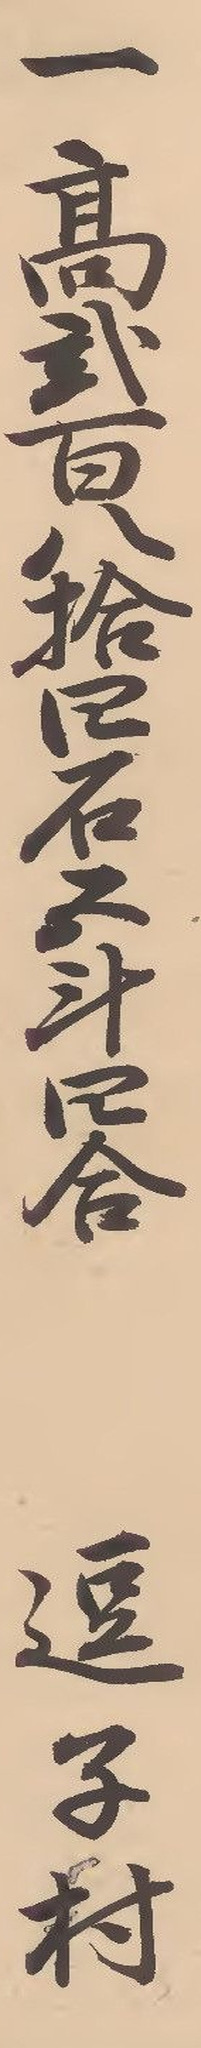一高弐百八拾四石五斗四合逗子村

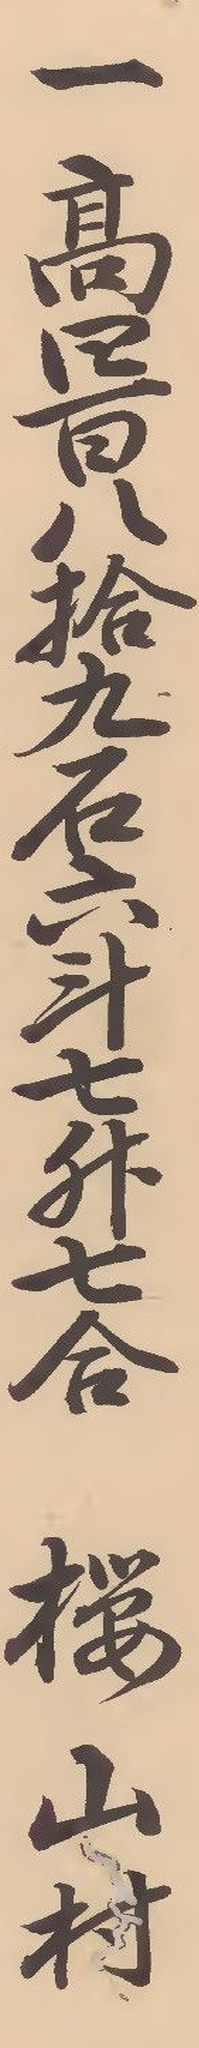一高四百八拾九石六斗七升七合桜山村
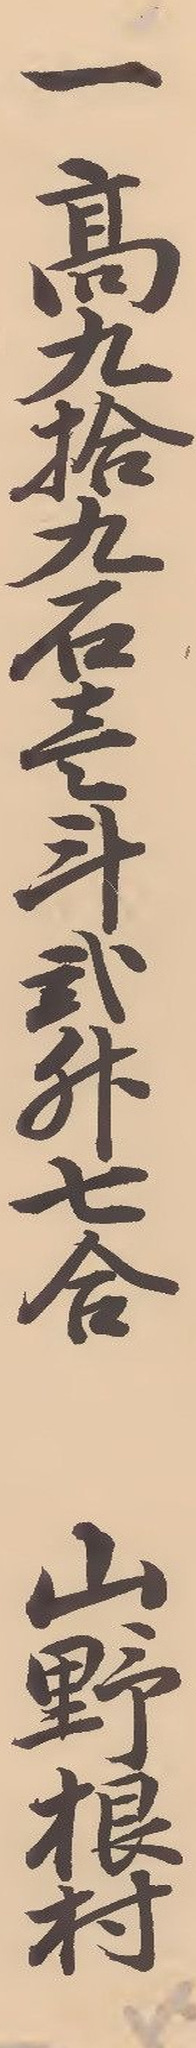一高九拾九石壱斗弐升七合山野根村
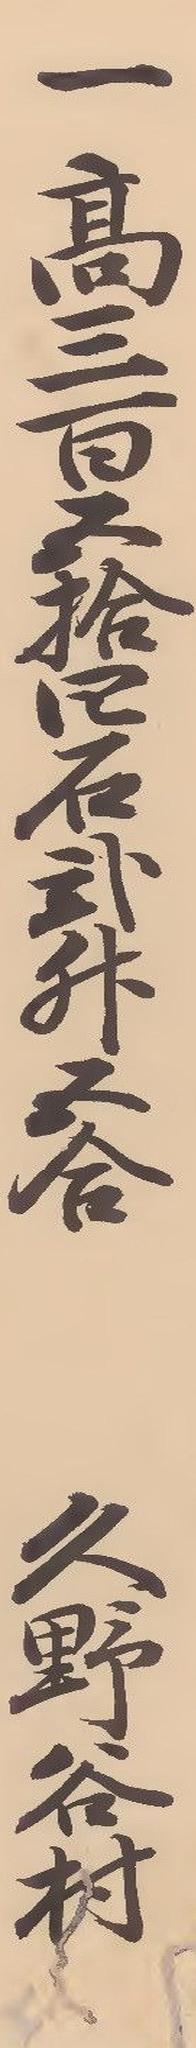一高三百五拾四石弐升五合久野谷村
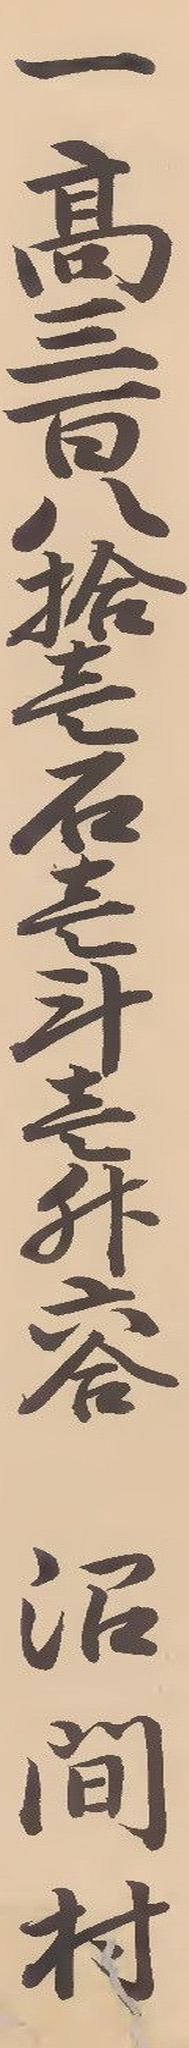一高三百八拾壱石壱斗壱升六合沼間村
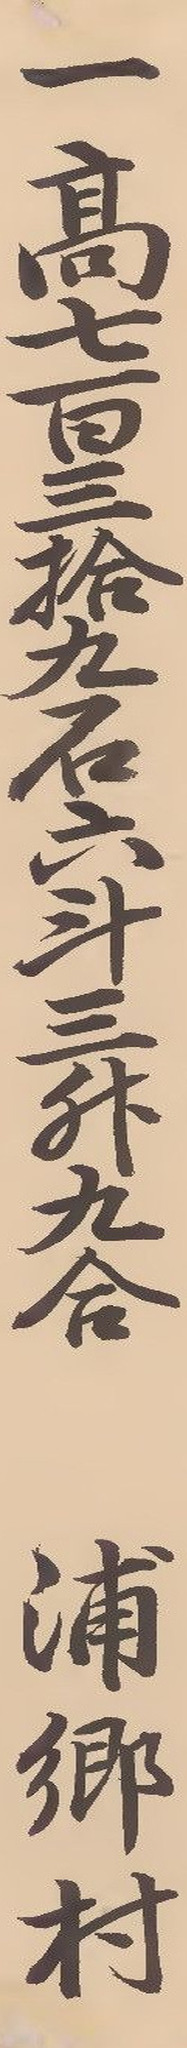一高七百三拾九石六斗三升九合浦郷村
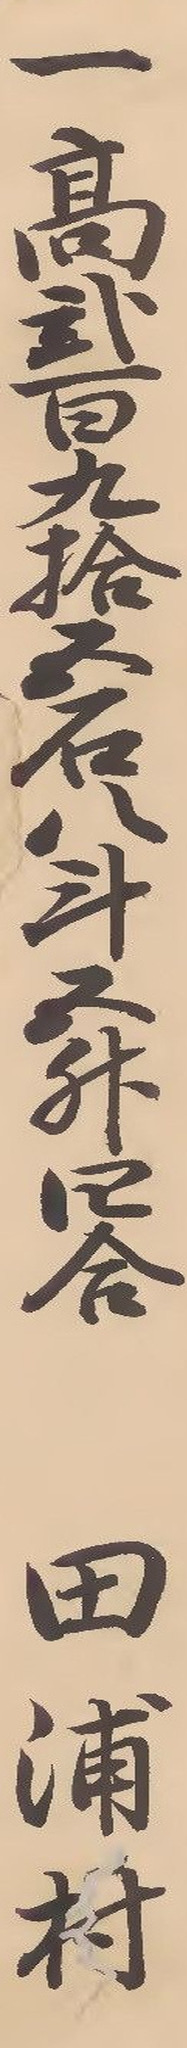一高弐百九拾五石八斗五升四合田浦村

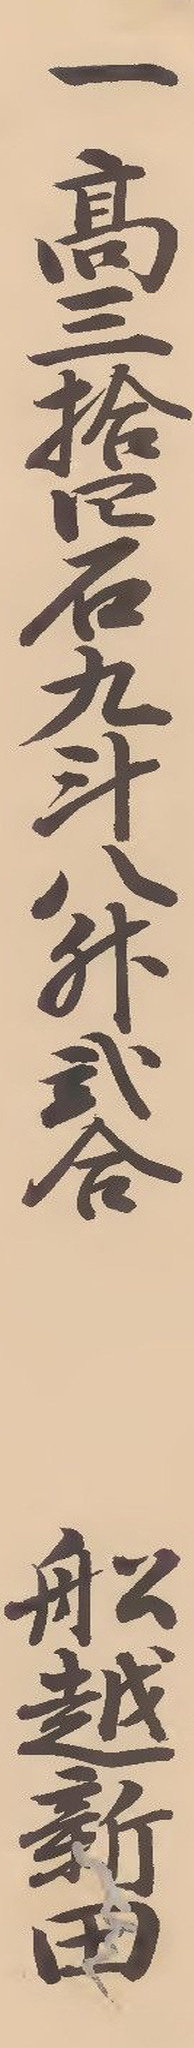一高三拾四石九斗八升弐合舩越新田
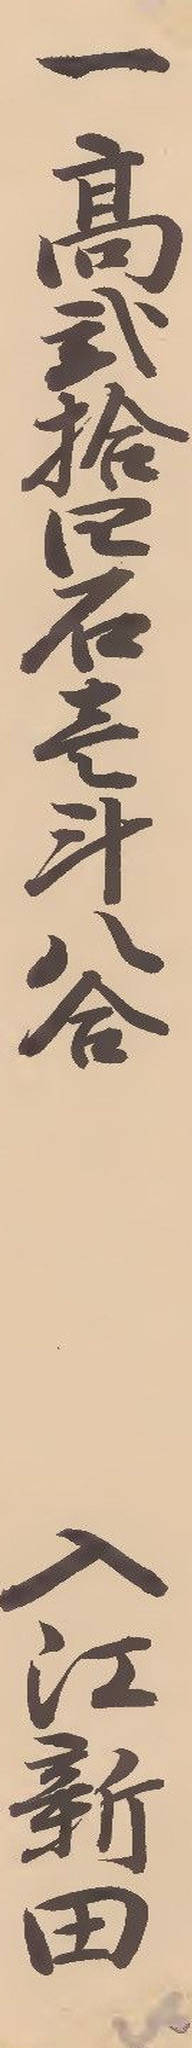一高弐拾四石壱斗八合入江新田
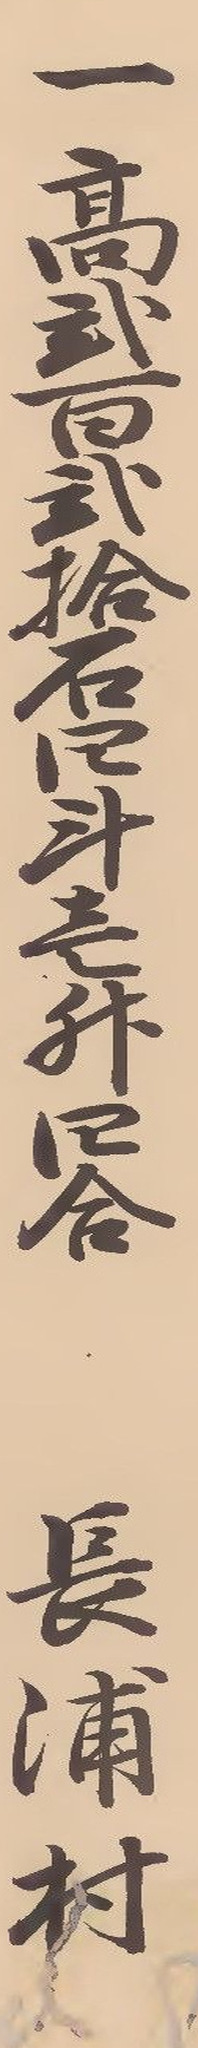一高弐百弐拾石四斗壱升四合長浦村
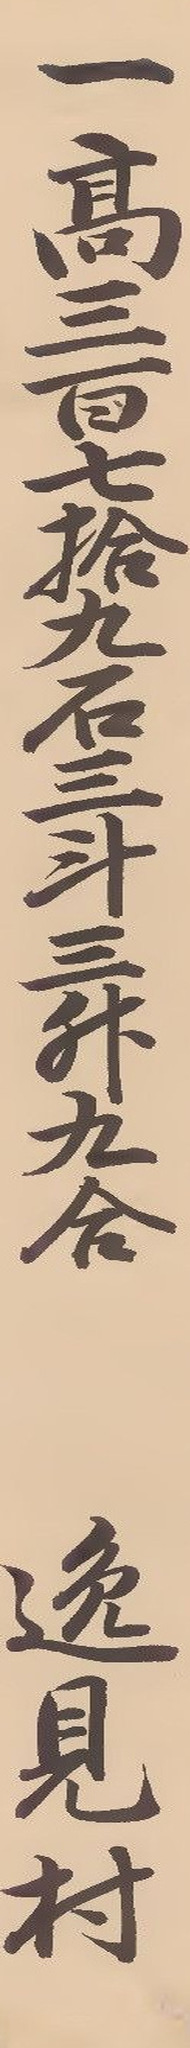一高三百七拾九石三斗三升九合逸見村
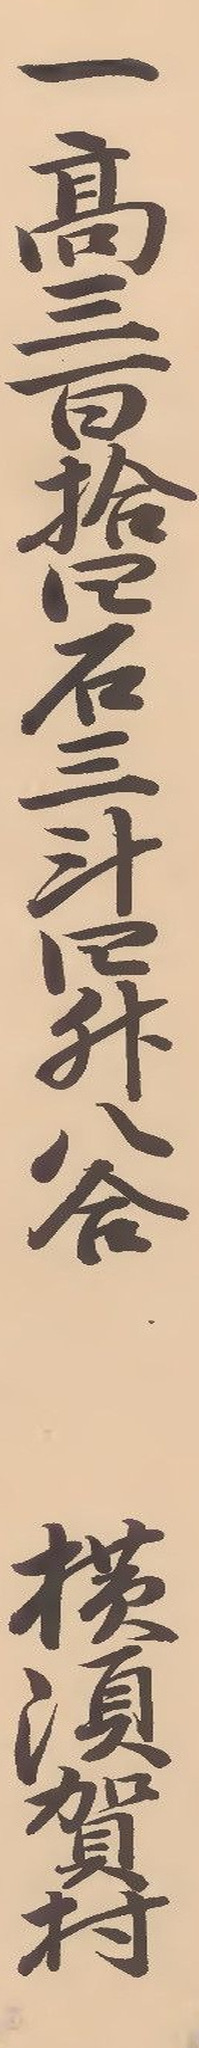一高三百拾四石三斗四升八合横須賀村
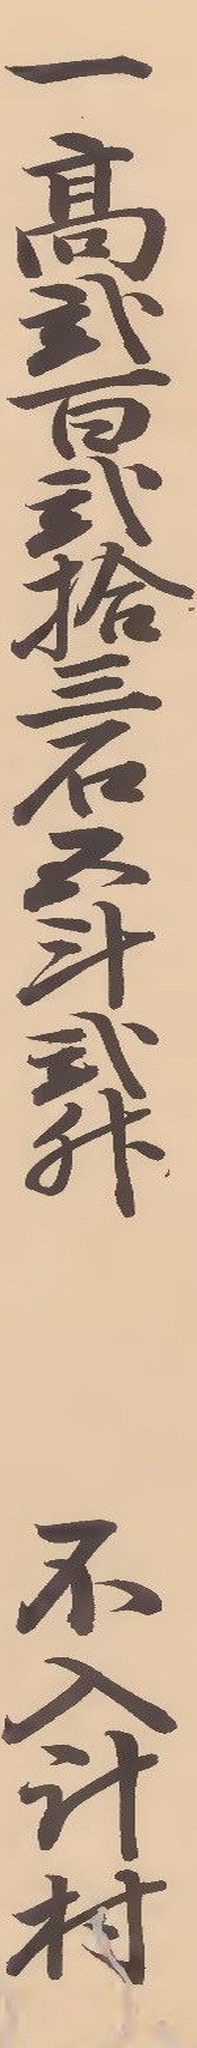一高弐百弐拾三石五斗弐升不入斗村
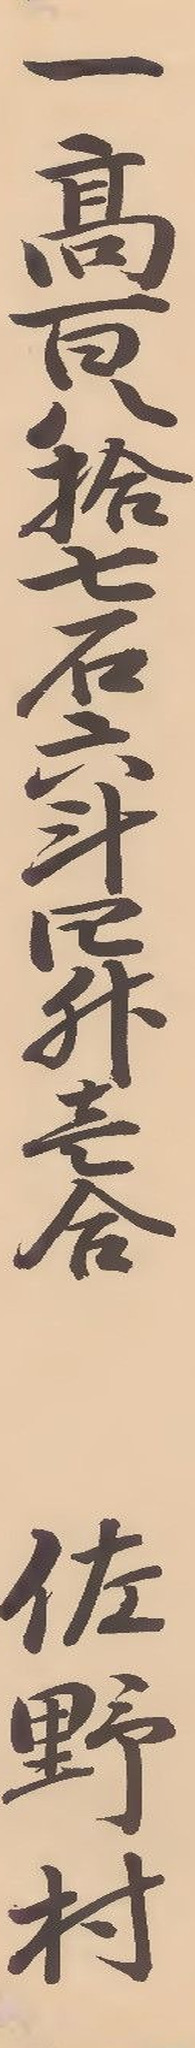一高百八拾七石六斗四升壱合佐野村
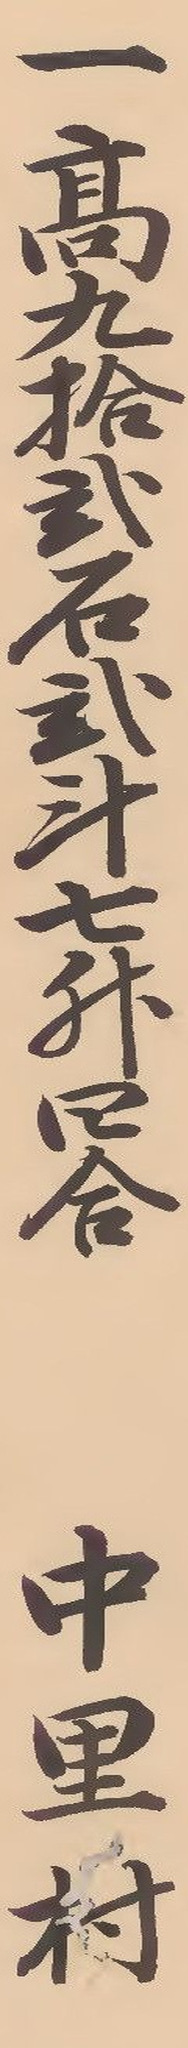一高九拾弐石弐斗七升四合中里村
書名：相模国郷帳
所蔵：国立公文書館 National Archives of Japan
